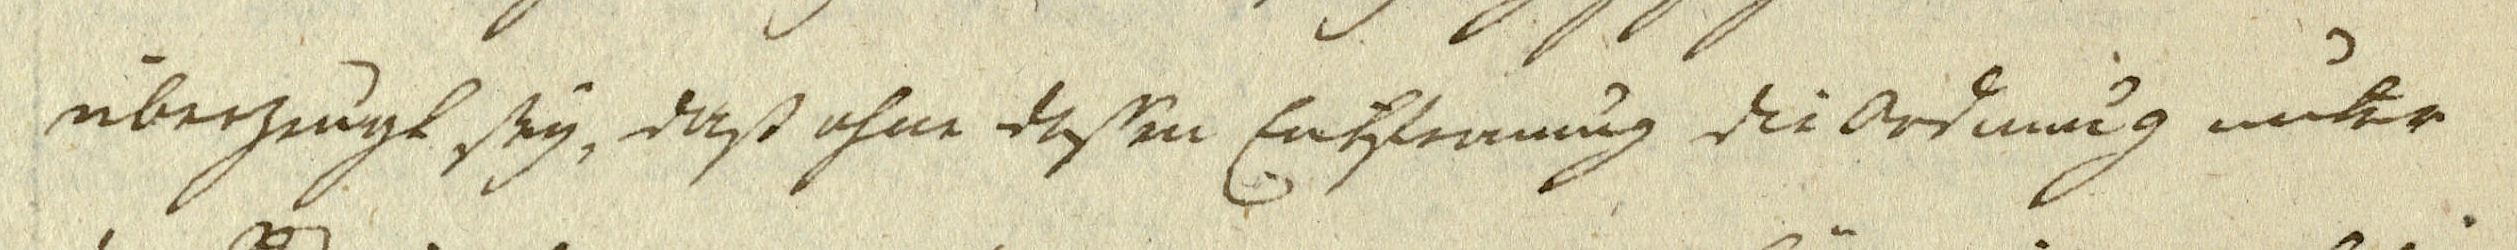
überzeugt seÿ, daß ohne dessen Entfernung die Ordnung unter
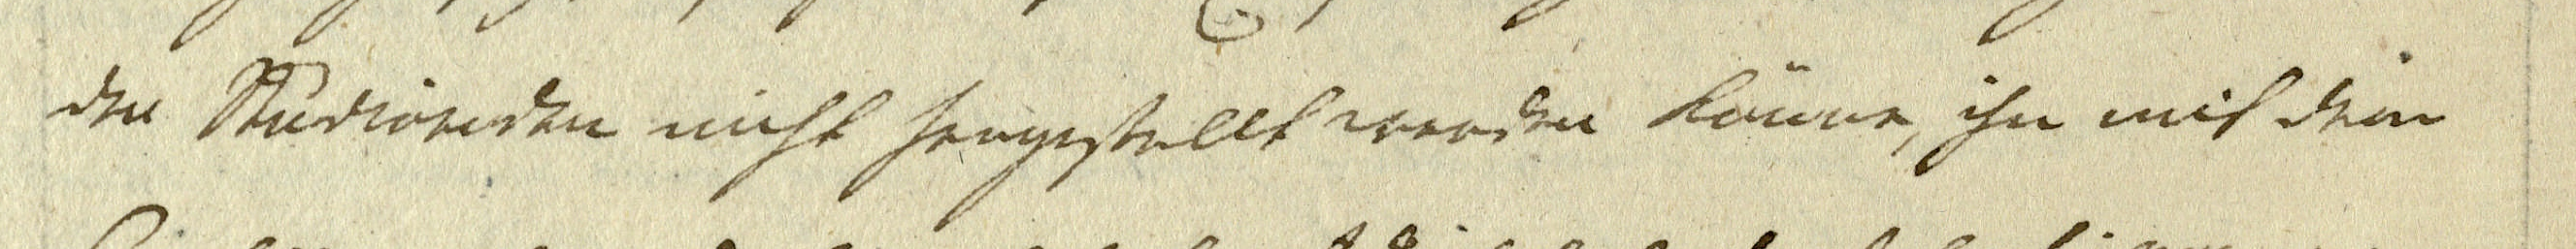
den Studirenden nicht hergestellt werden könne, ihn mit dem
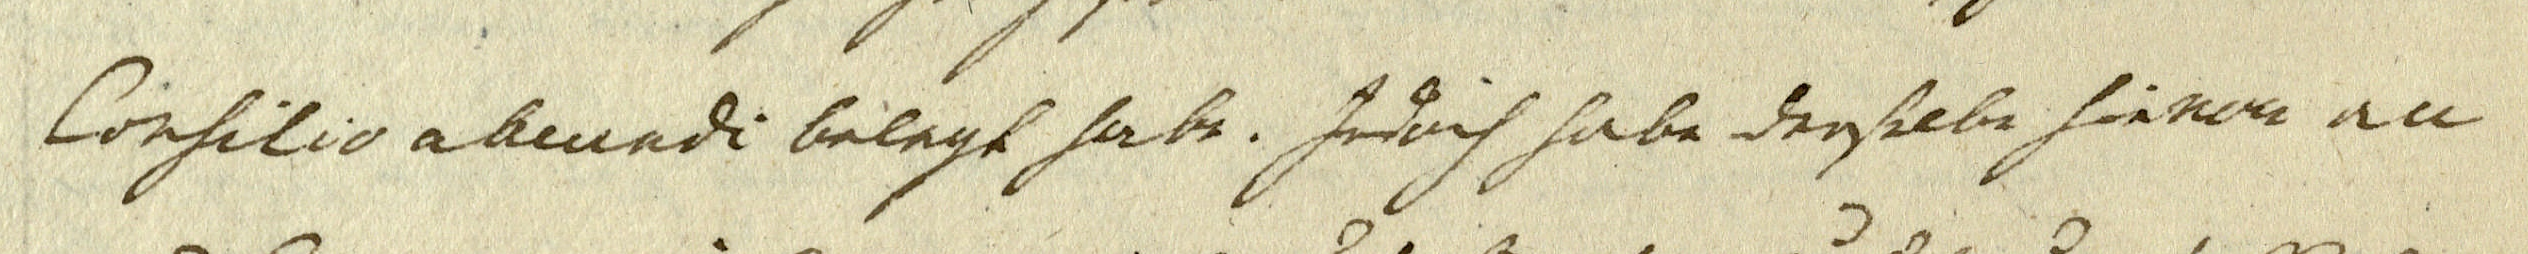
Consilio abeundi belegt habe. Jedoch habe derselbe hievon an
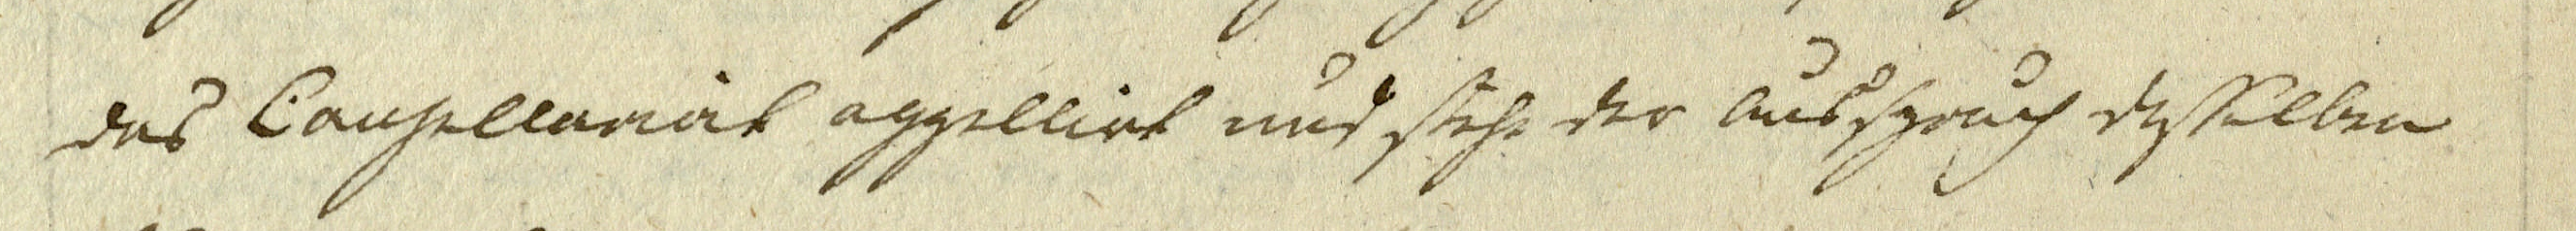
das Canzellariat appellirt und sehe der Ausspruch desselben
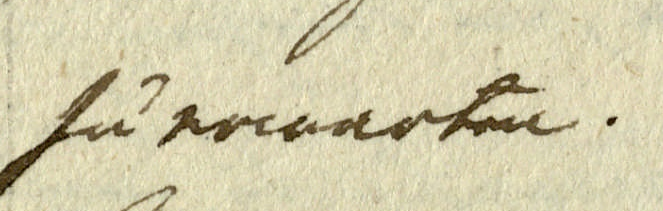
zu erwarten.
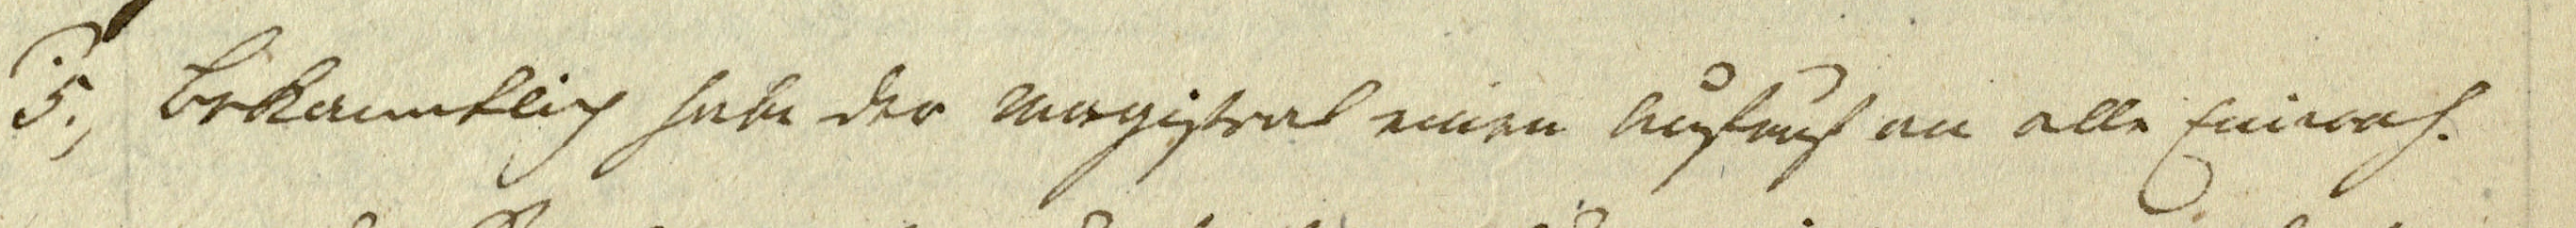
5., Bekanntlich habe der Magistrat einen Aufruf an alle Einwoh¬
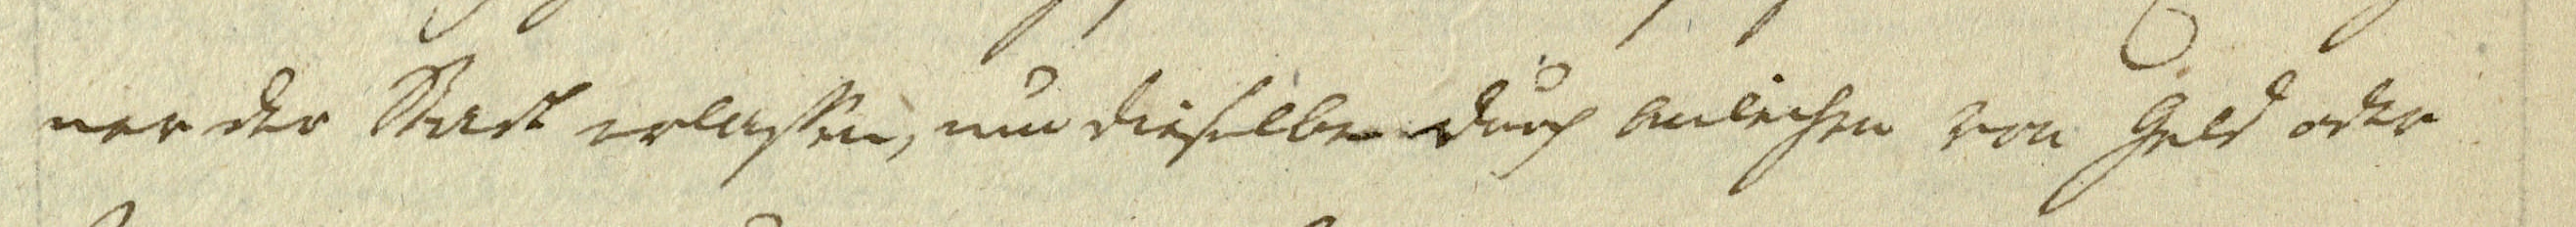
ner der Stadt erlassen, um dieselbe durch Anleihen von Geld oder
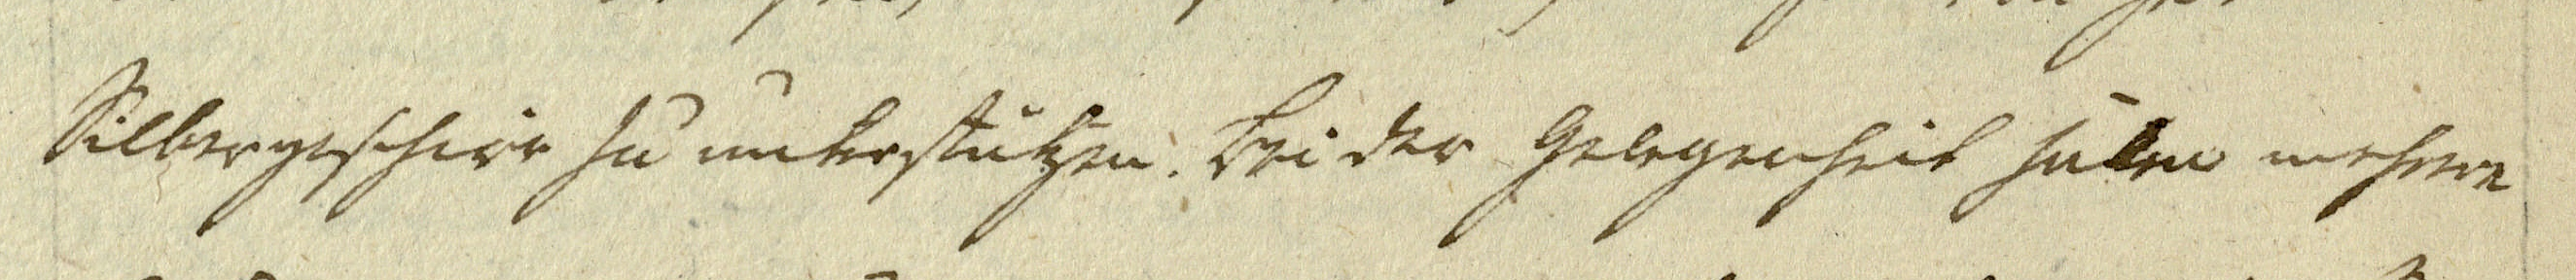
Silbergeschirr zu unterstützen Bei der Gelegenheit hätten mehrere
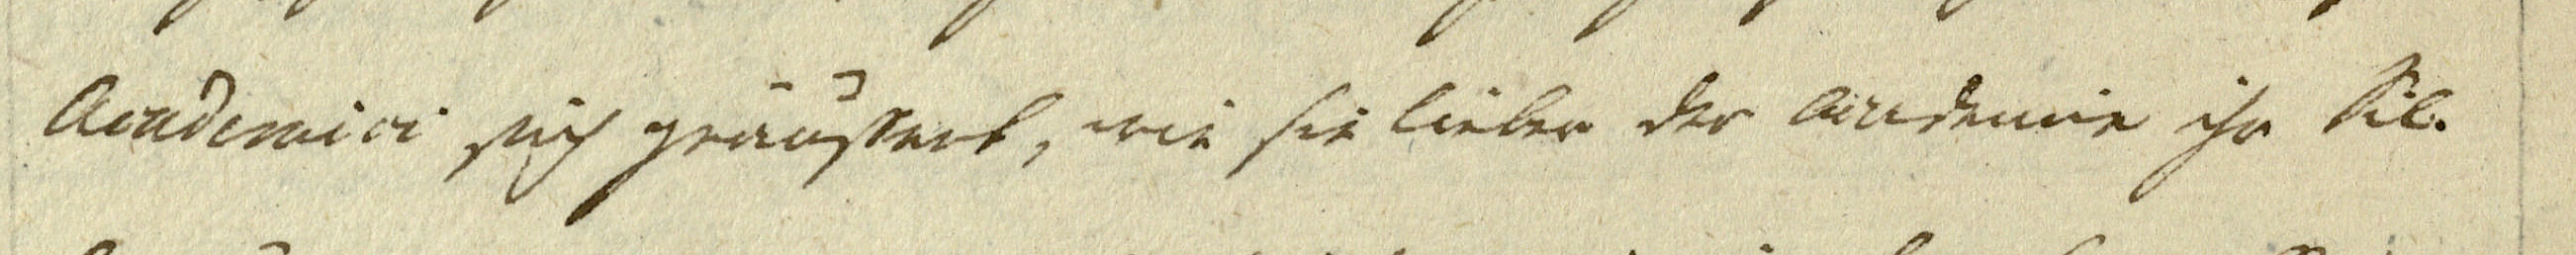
Academici sich geäussert, wie sie lieber der Academie ihr Sil¬
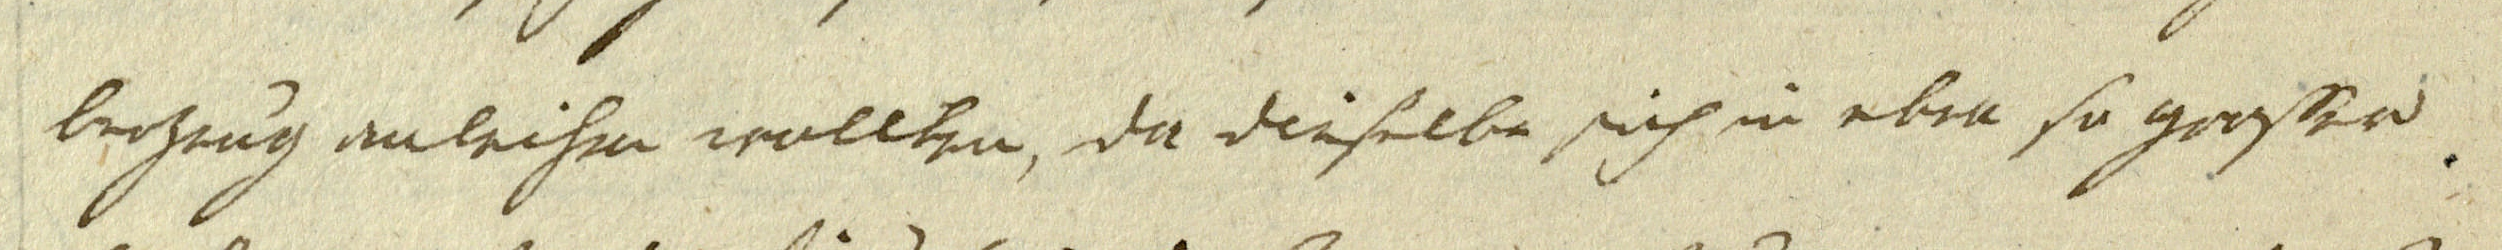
berzeug anleihen wollten, da dieselbe sich in eben so grosser
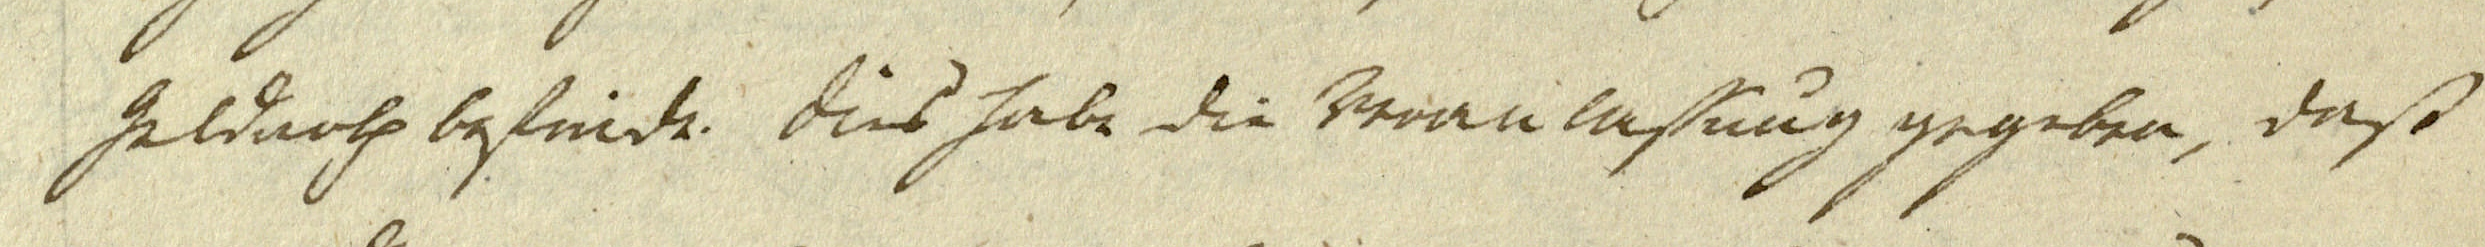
Geldnoth befinde. Dies habe die Veranlassung gegeben, daß
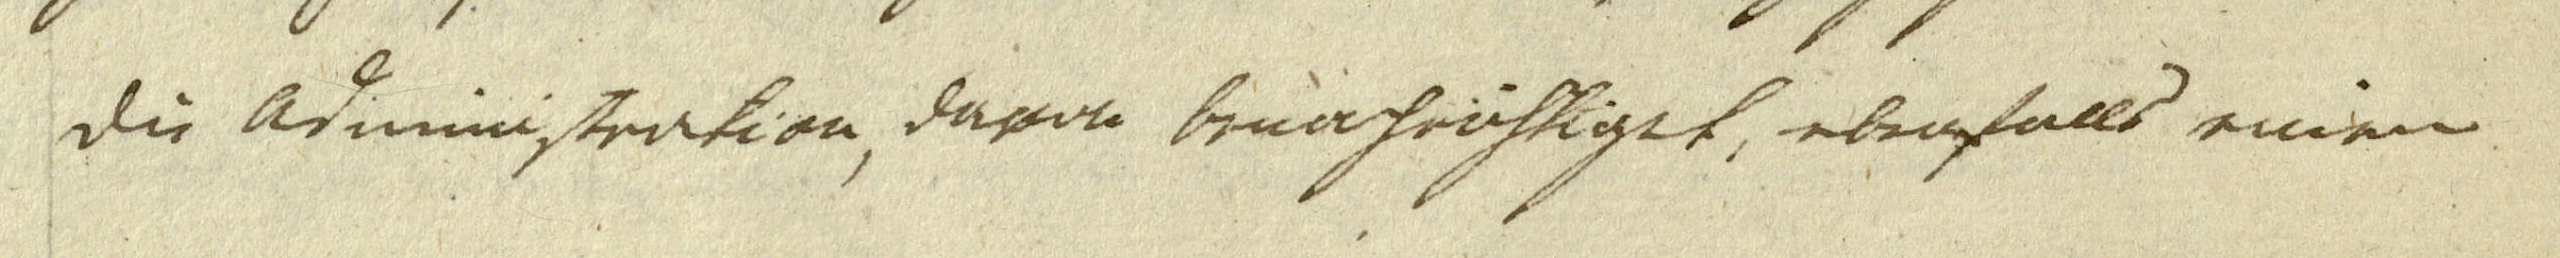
die Administration, davon benachrichtiget, ebenfalls einem
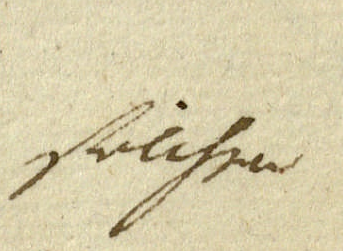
solchen
